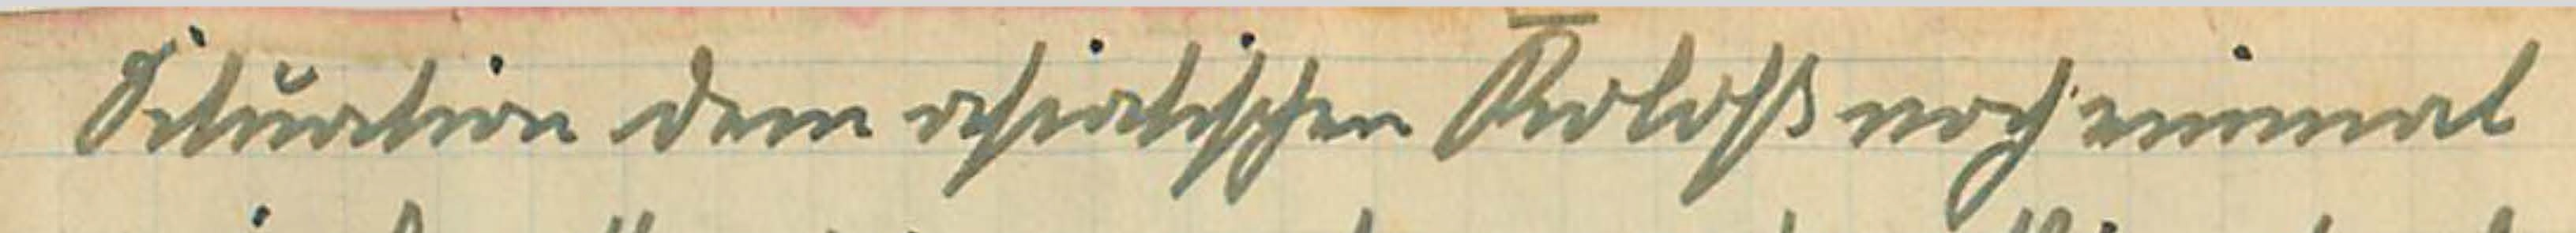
Situation dem asiatischen Koloß noch einmal
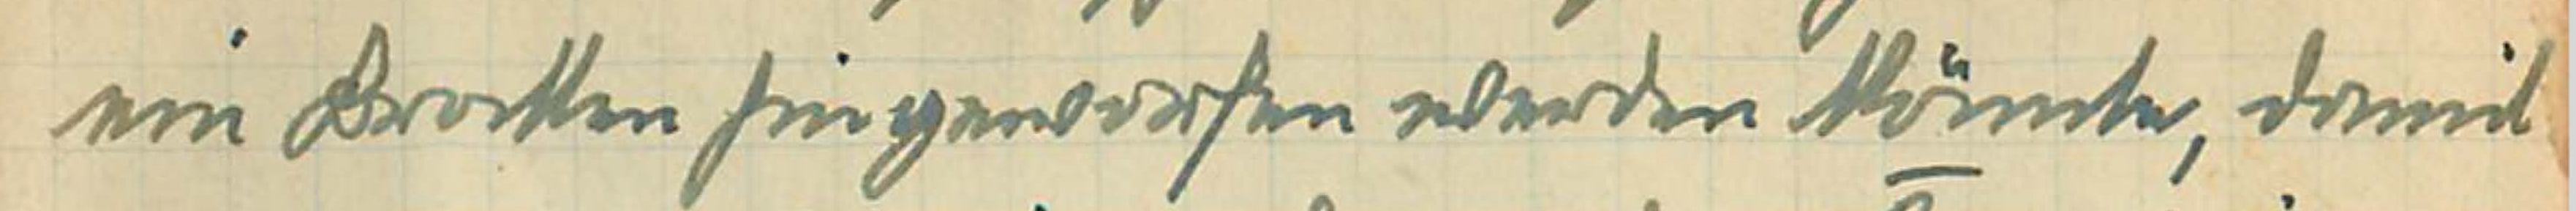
ein Brocken hingeworfen werden könnte, damit
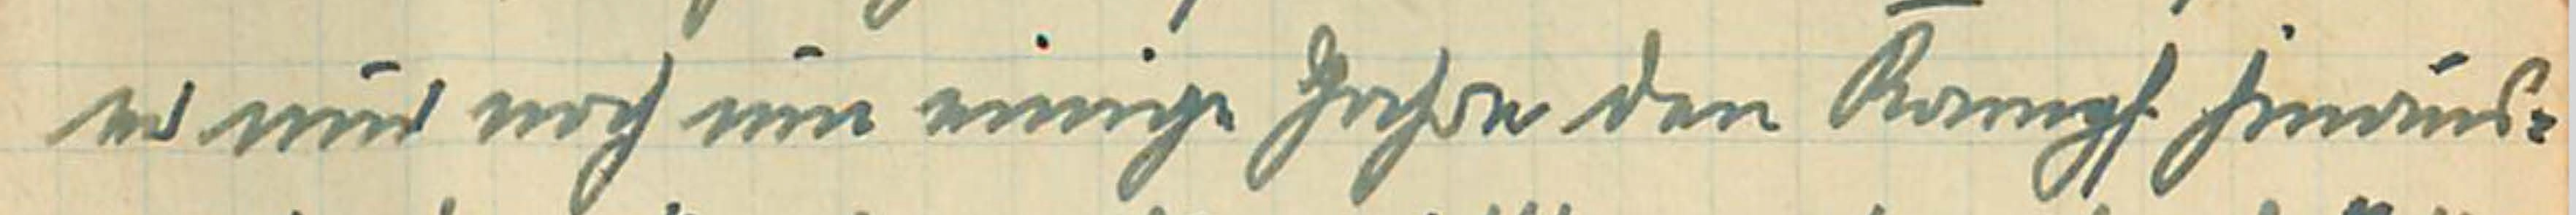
er nur noch um einige Jahre den Kampf hinaus-
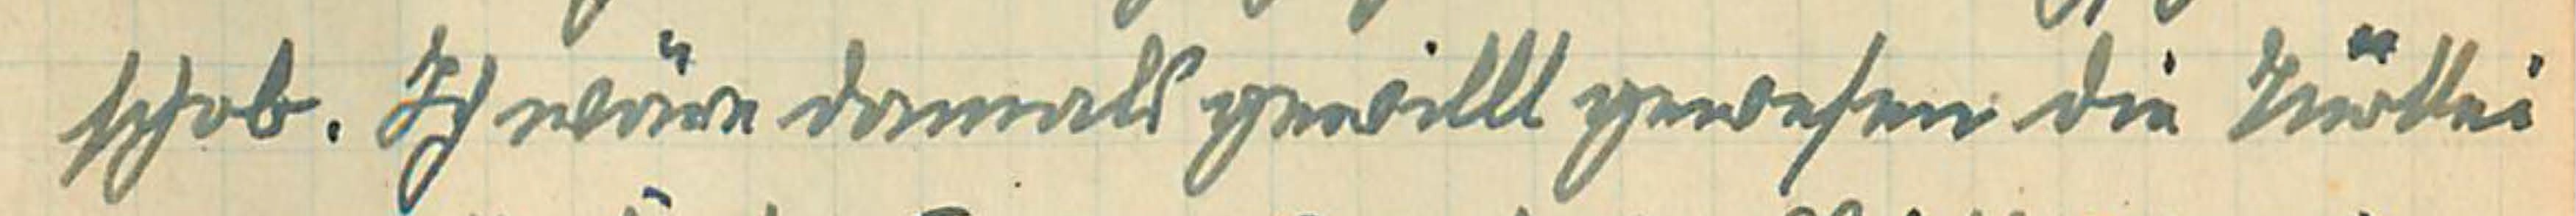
schob. Ich wäre damals gewillt gewesen die Türkei
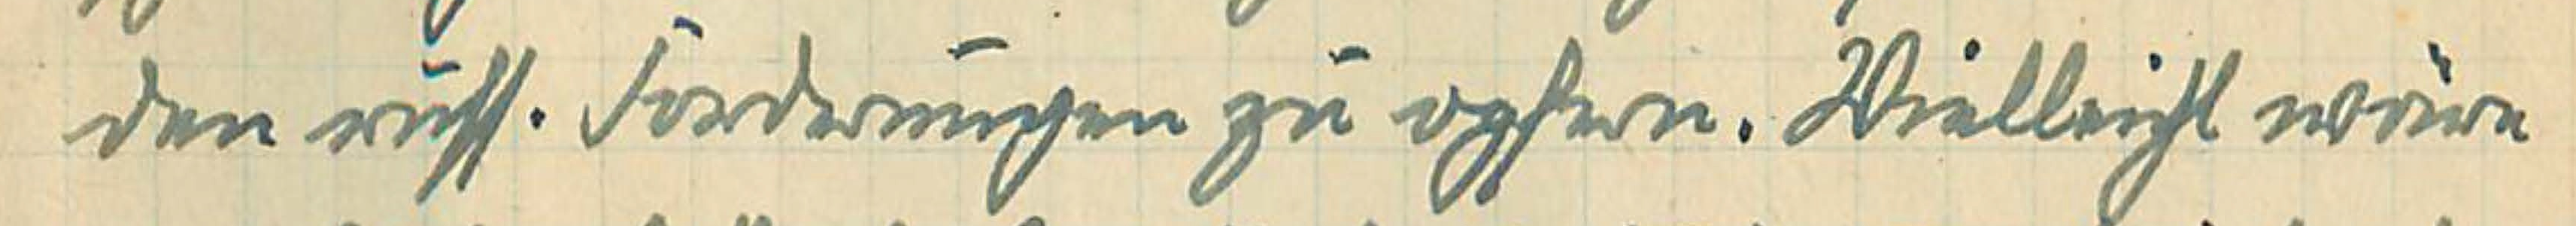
den russ. Forderungen zu opfern. Vielleicht wäre
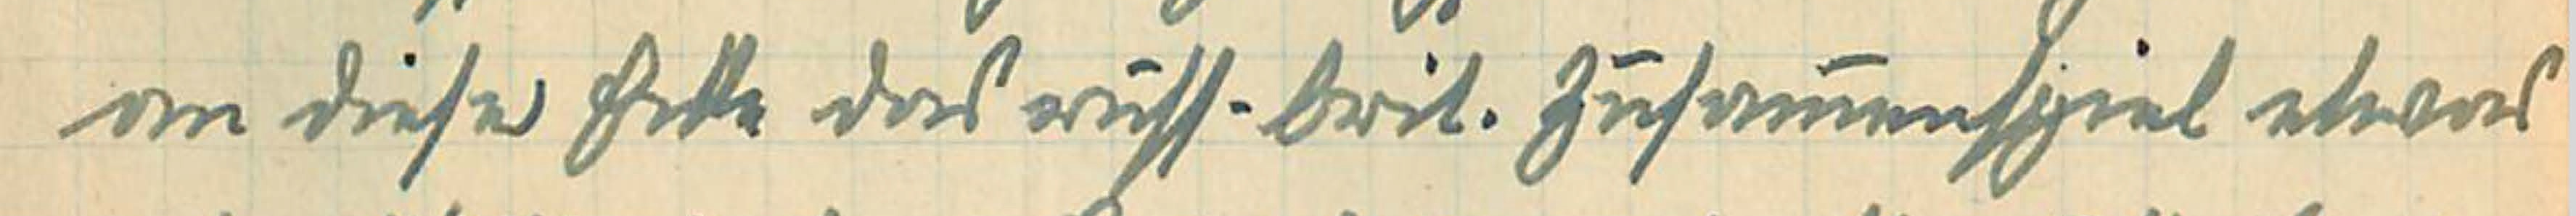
an dieser Ecke dar russ-brit. Zusammenspiel etwas
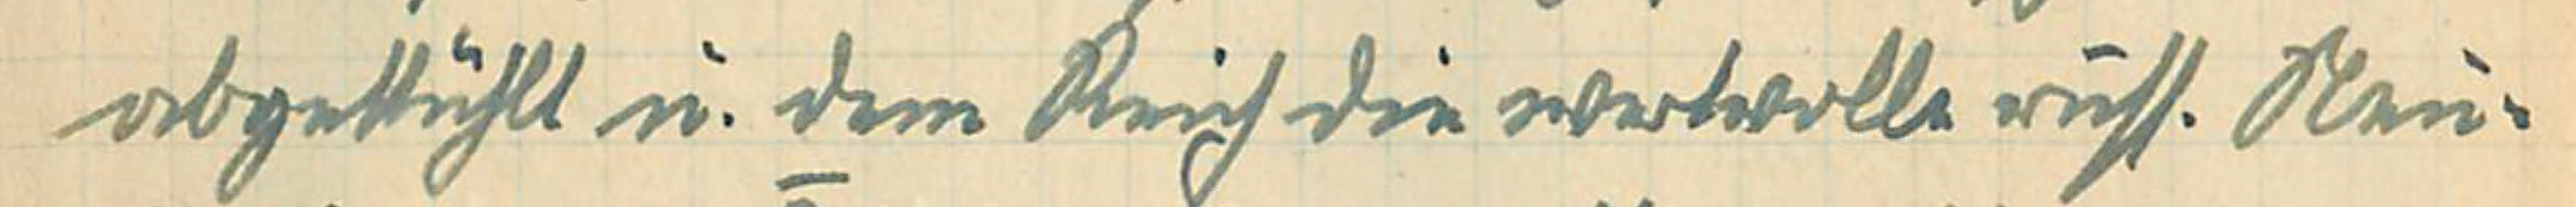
abgekühlt u. dem Reich die wertvolle russ. Neu-
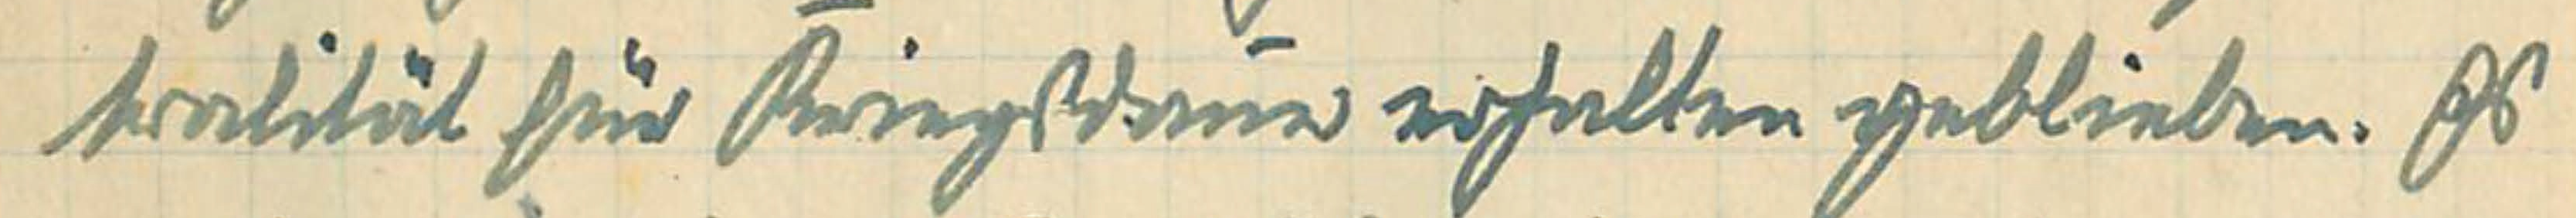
tralität für Kriegsdauer erhalten geblieben. Es
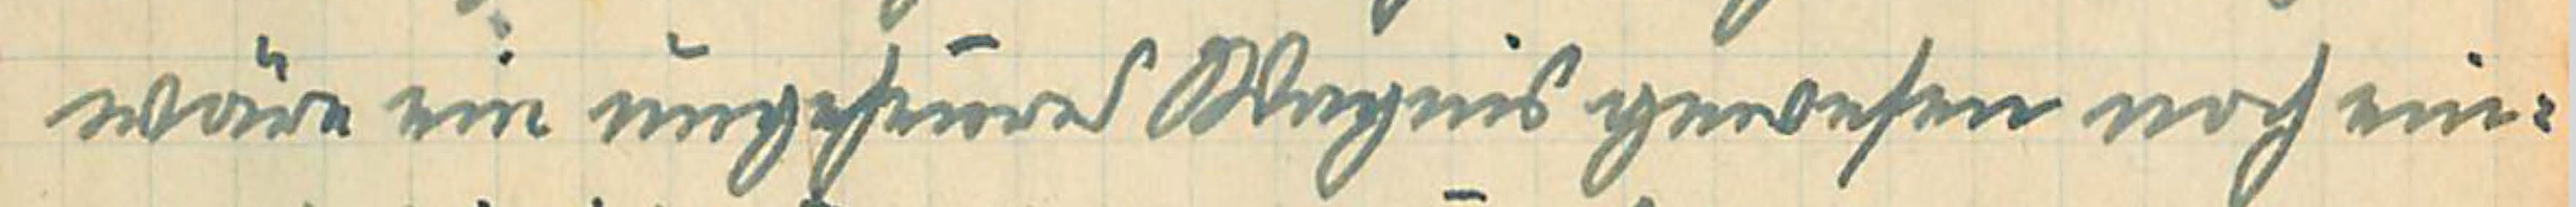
wäre ein ungeheures Wagnis gewesen noch ein-
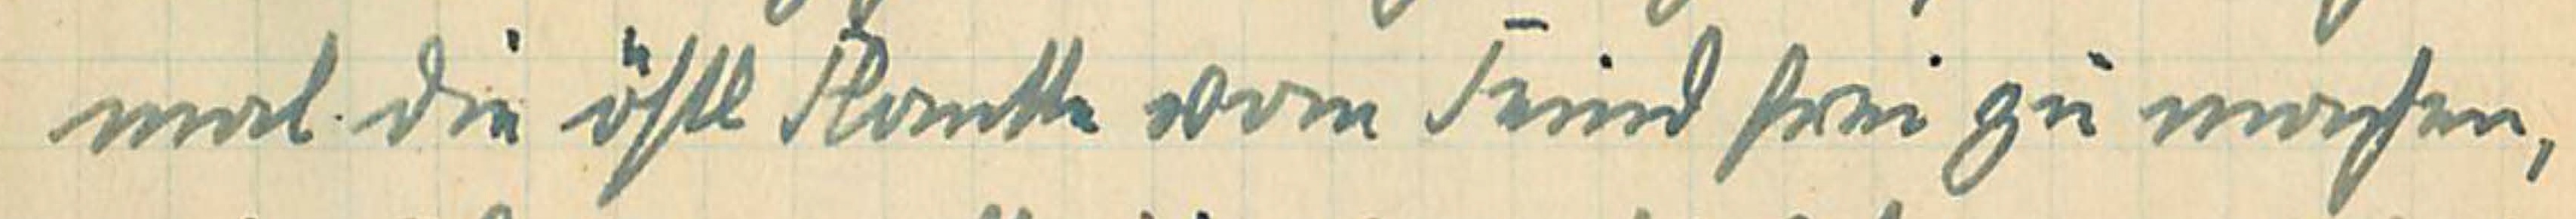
mal die östl Flanke vom Feind frei zu machen,
